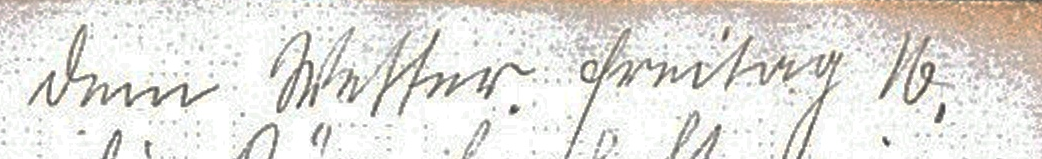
dem Wetter. Freitag 16.
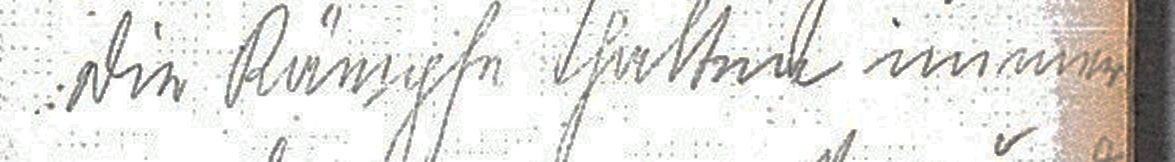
die Kämpfe halten immer
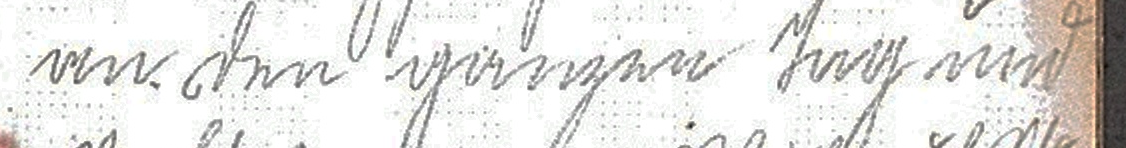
an. Den ganzen Tag und
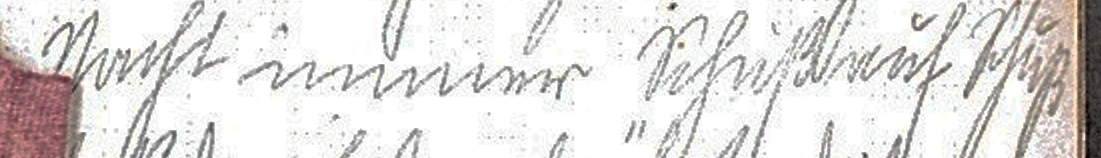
Nacht immer Schuß auf Schuß
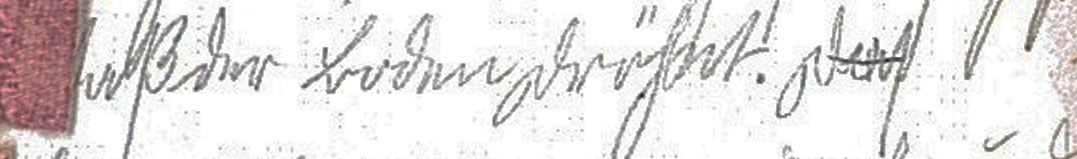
daß der Boden dröhnt.
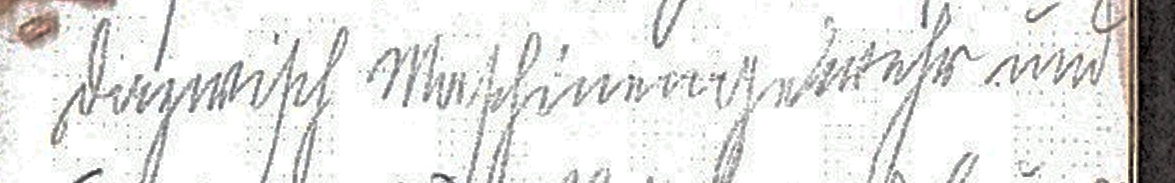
Dazwisch Maschinengewehr und
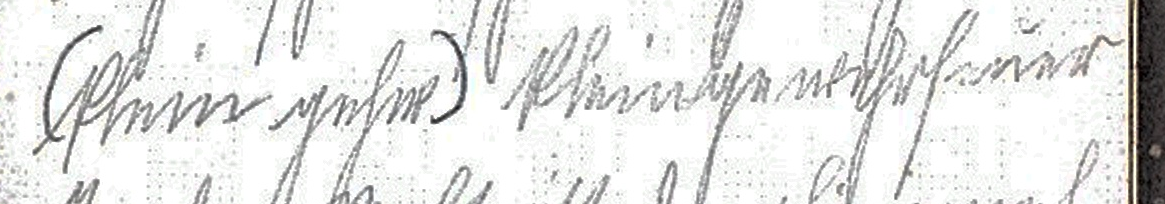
(Klein gehe) Kleingewehrfeuer
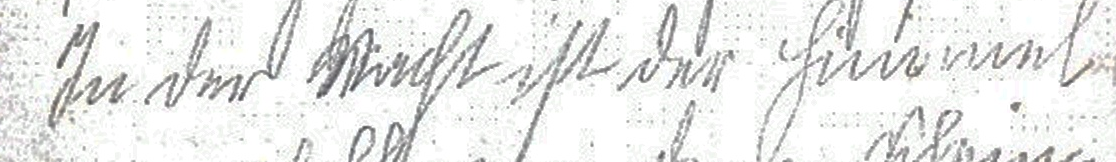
In der Nacht ist der Himmel
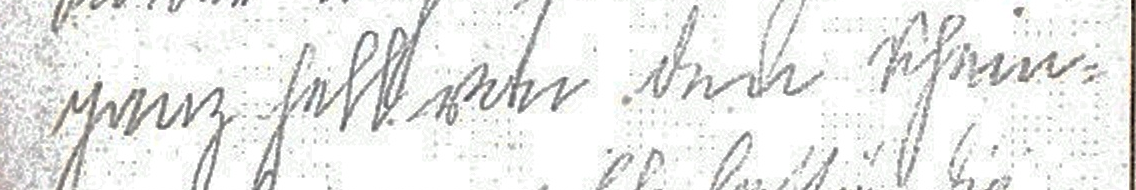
ganz hell von den Schein-
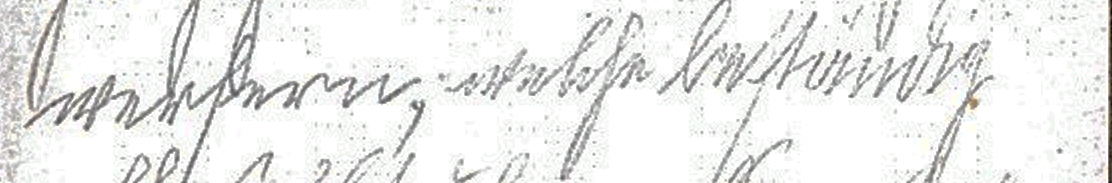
werfern, welche beständig
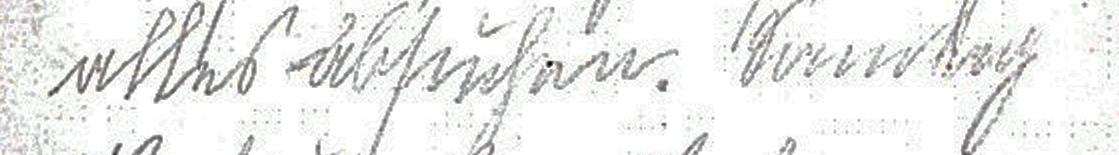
alles absuchen. Sonntag
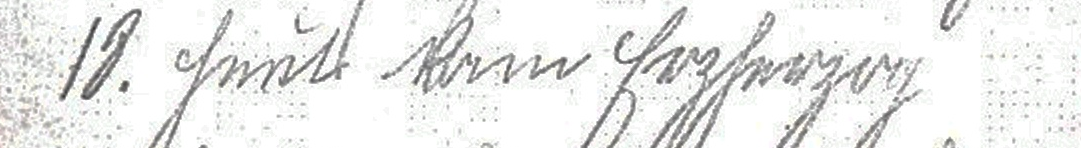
18. Heut kam Erzherzog
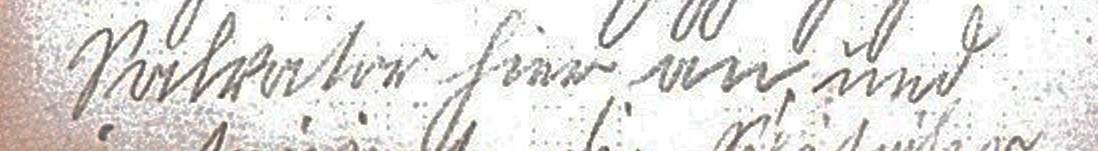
Salvator hier an, und
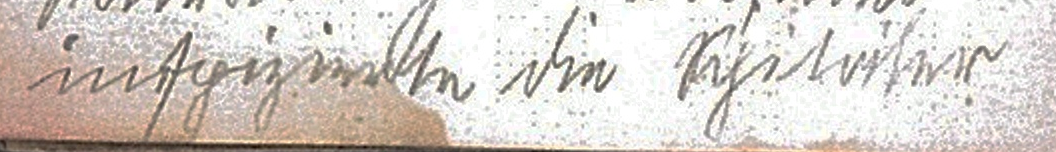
inspizierte die Schitviter
